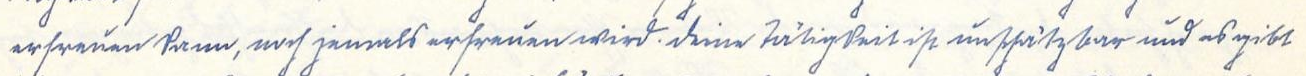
erfreuen kann, noch jemals erfreuen wird. Eine Tätigkeit ist unschätzbar und es gibt
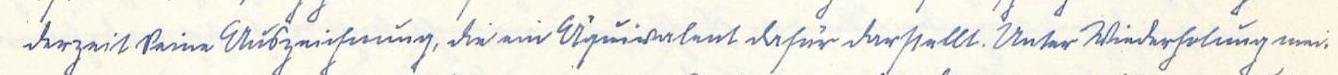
derzeit keine Auszeichnung, die ein Äquivalent dafür darstellt. Unter Wiederholung mein-
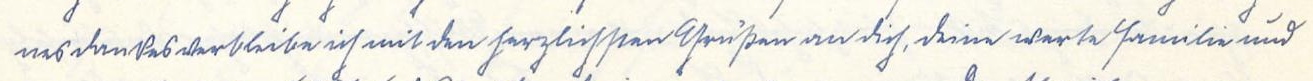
es Dankes verbleibe ich mit den herzlichsten Grüßen an Dich, deine werte Familie und
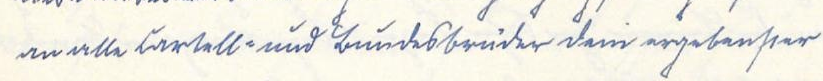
an alle Cartell- und Bundesbrüder bei der Gegend dein ergebenster
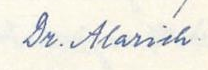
Dr. Alarich
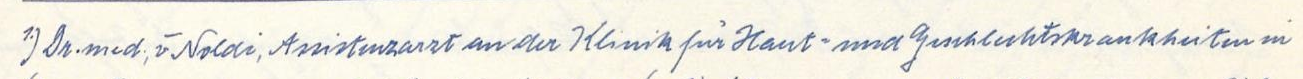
1) Dr. med. v/o Noldi, Assistenzarzt an der Klinik für Haut- und Geschlechtskrankheiten in
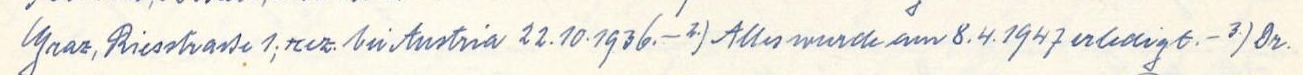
Graz, Rriestraße 1, rez. bei Austria 20.10.1936.- 2) Alles wurde am 8.4.1947 erledigt. 3) Dr.
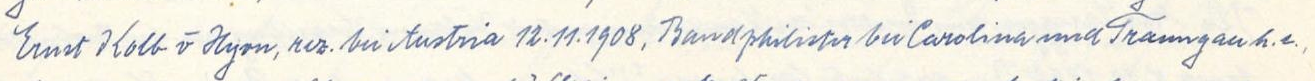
Ernst Kolb v/o Hyon, rez. bei Austria 12.11.1908, Bandphilister bei Carolina und Traungau h. c.
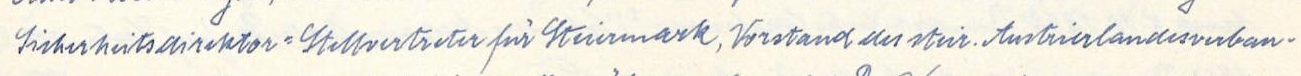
Sicherheitsdirektor-Stellvertreter für Steiermark, Vorstand der steir. Austrier.andesverban-
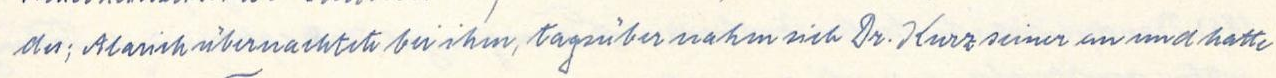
des; Alarich übernachtete bei ihm, tagsüber nahm sich Dr. Kurz seiner an und hatte
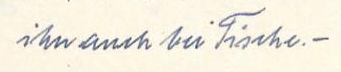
ihn auch bei Tische.-
